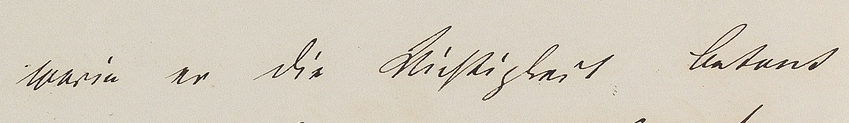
worin er die Wichtigkeit betont
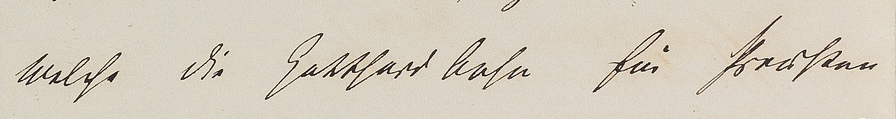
welche die Gotthardbahn für Preußen
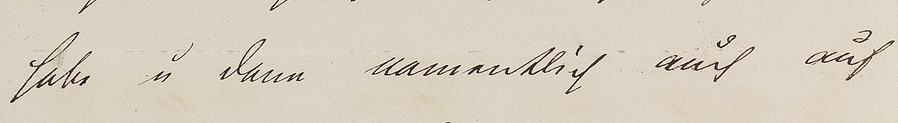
habe u dann namentlich auch auf
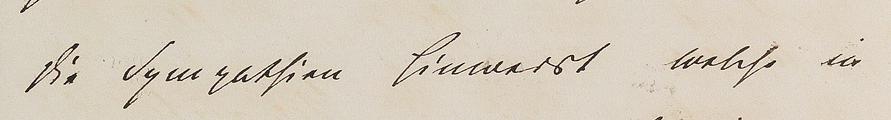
die Sympathien hinweist welche in
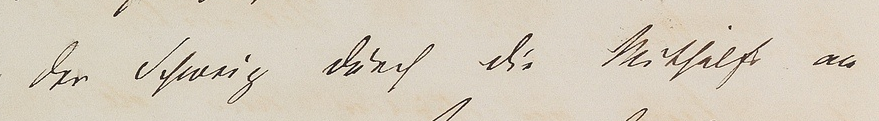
der Schweiz durch die Mithilfe an
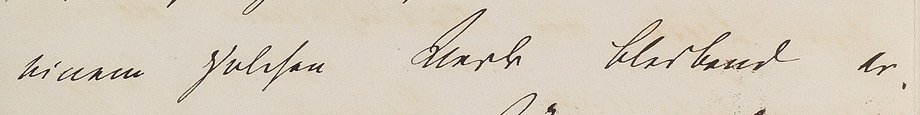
einem solchen Werk bleibend er-
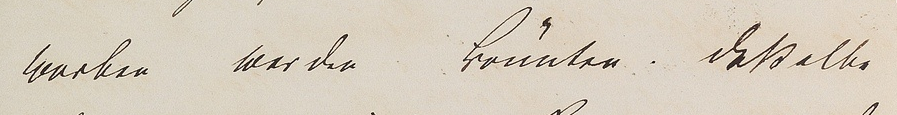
worben werden könnten. Dasselbe
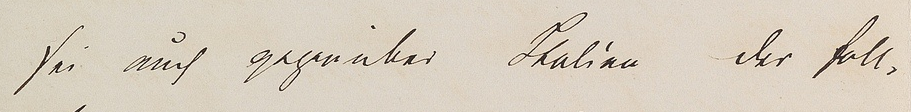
sei auch gegenüber Italien der Fall.
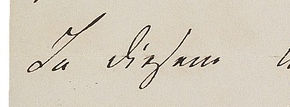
In diesem
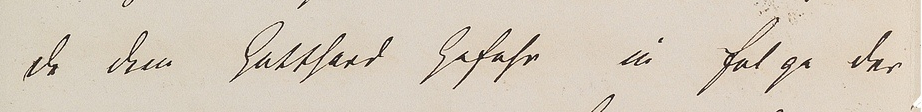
de dem Gotthard Gefahr in Folge der
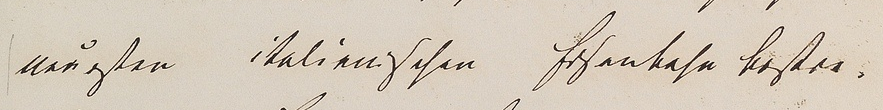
neuesten italienischen Eisenbahn bestre-
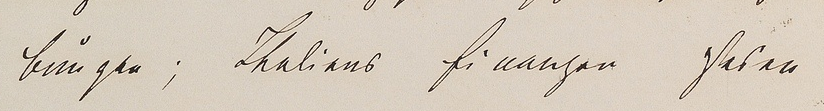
bungen; Italiens Finanzen seien
